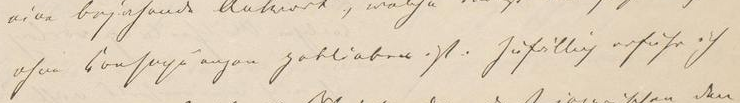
ohne Consequenzen geblieben ist. Zufällig erfuhr ich
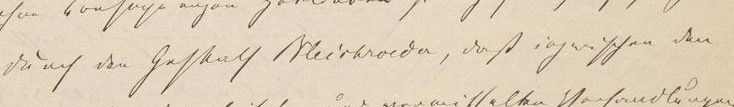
durch den GehRath Bleichroeder, daß inzwischen den
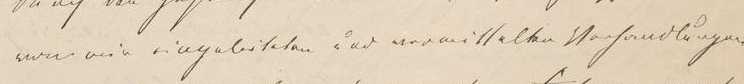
von mir eingeleiteten und vermittelten Verhandlungen
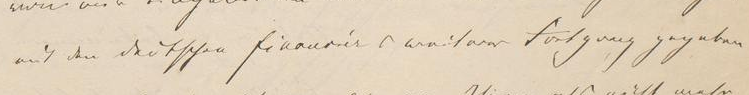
mit den deutschen Financiers weitern Fortgang gegeben
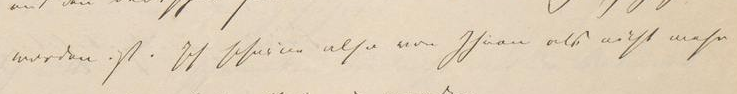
worden ist. Ich scheine also von Ihnen als nicht mehr
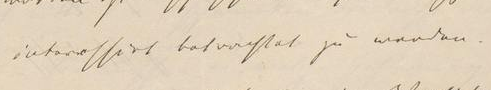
interessirt betrachtet zu werden.
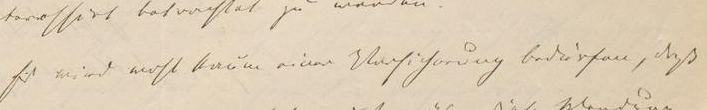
Es wird wohl kaum einer Versicherung bedürfen, daß
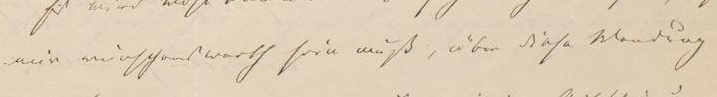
mir wünschenswerth sein muß, über diese Wendung
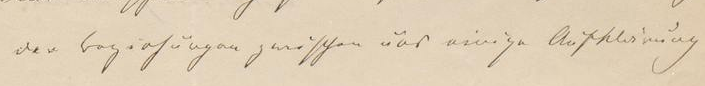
der Beziehungen zwischen uns einige Aufklärung
